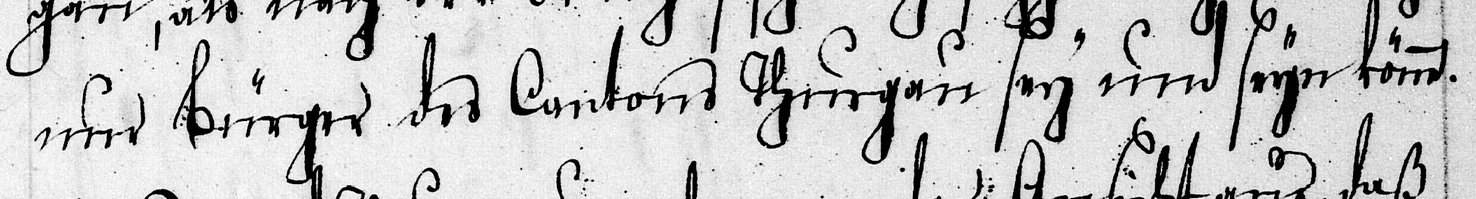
nur Bürger des Cantons Thurgau sey und seyn könn¬
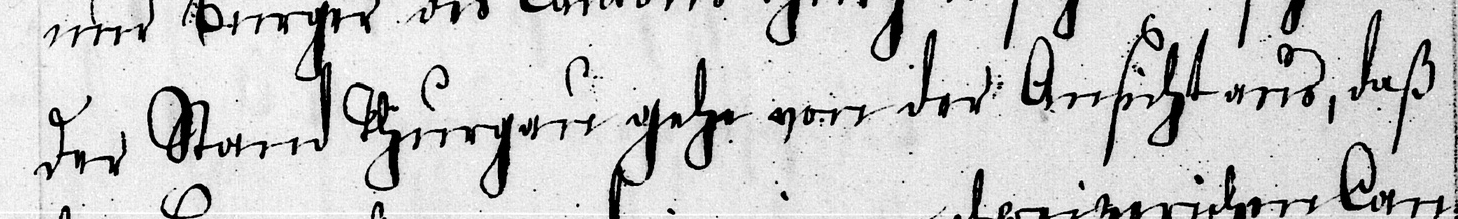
Der Stand Thurgau gehe von der Ansicht aus, daß
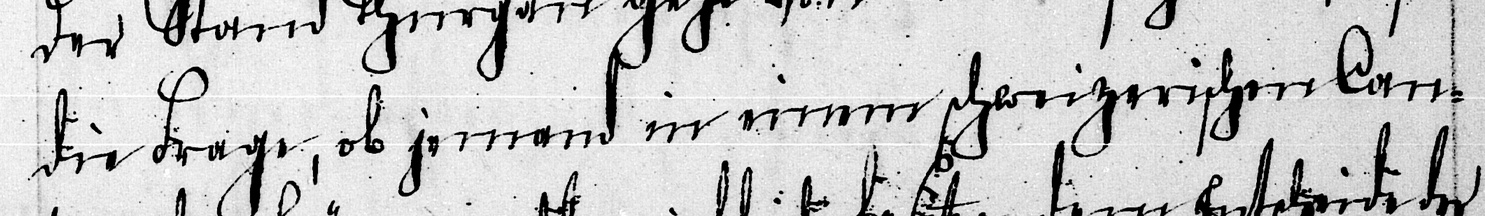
die Frage, ob jemand in einem schweizerischen Can¬
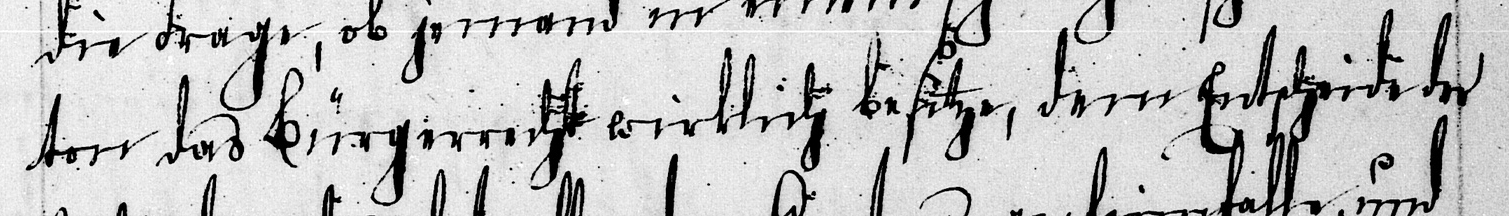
ton das Bürgerrecht wirklich besitze, dem Entscheide der
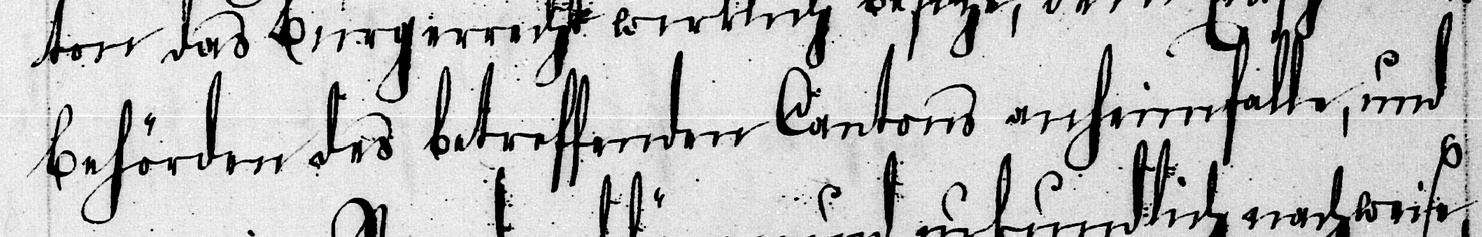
Behörden des betreffenden Cantons anheimfalle, und
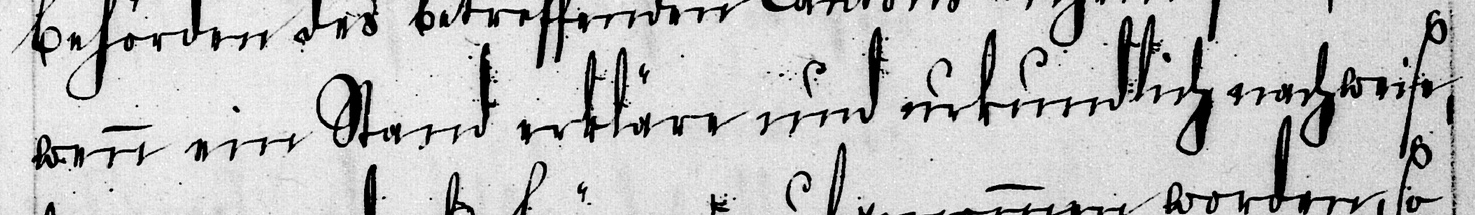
wenn ein Stand erkläre und urkundlich nachweise,
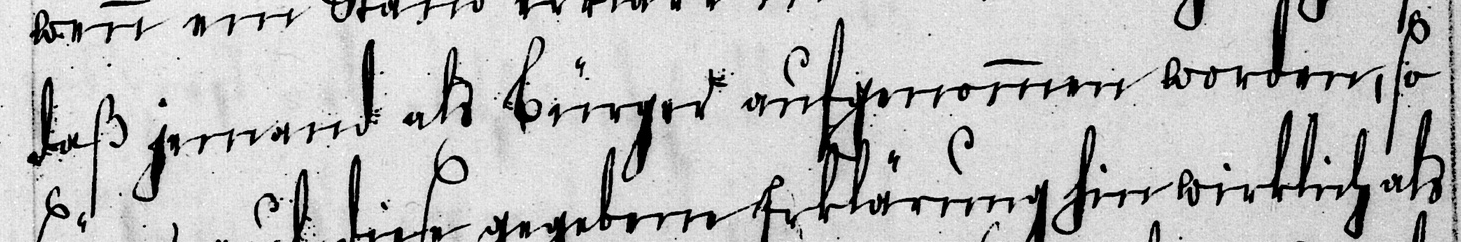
daß jemand als Bürger aufgenommen worden, so
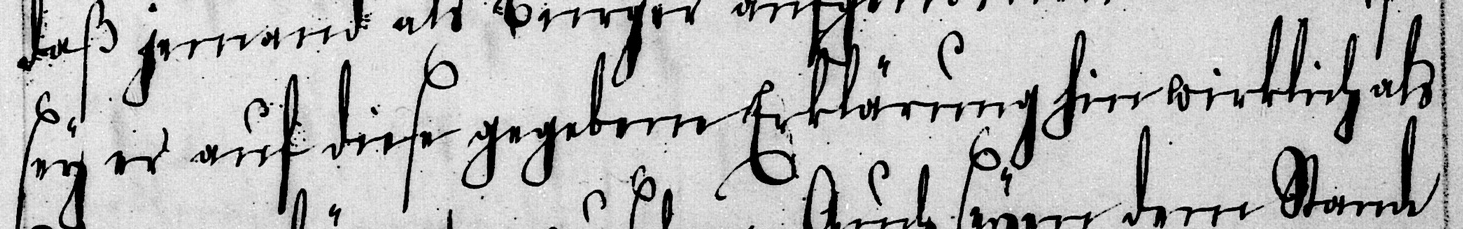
sey er auf diese gegebene Erklärung hin wirklich als
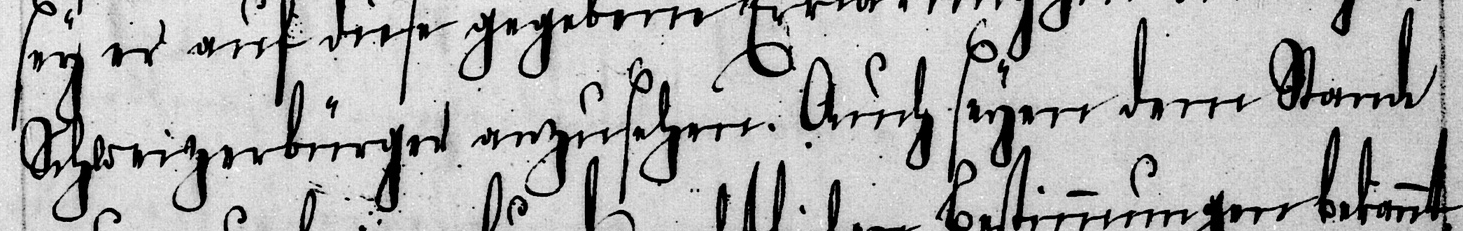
Schweizerbürger anzusehen. Auch seyen dem Stande
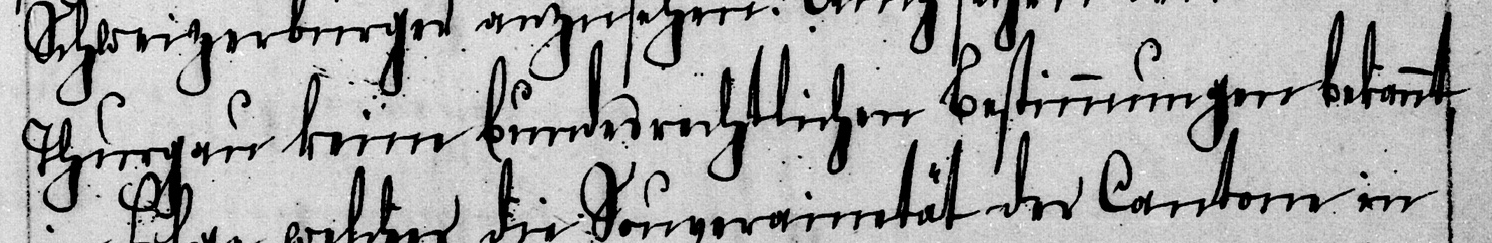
Thurgau keine bundesrechtlichen Bestimmungen bekannt,
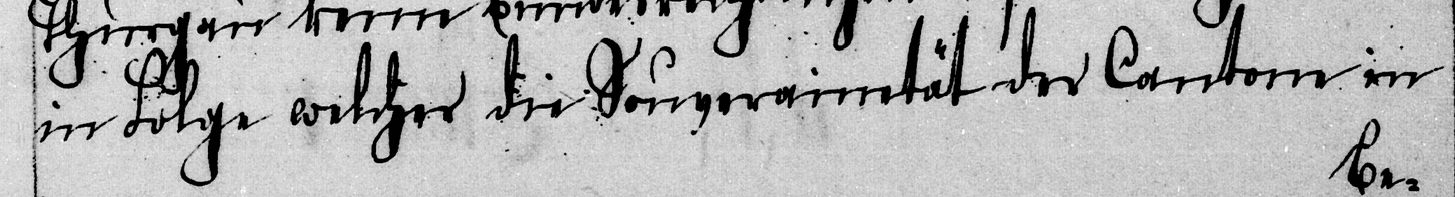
in Folge welcher die Souverainetät der Cantone in
